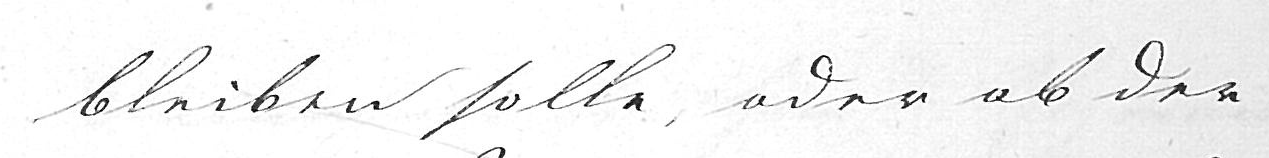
bleiben solle, oder ob der
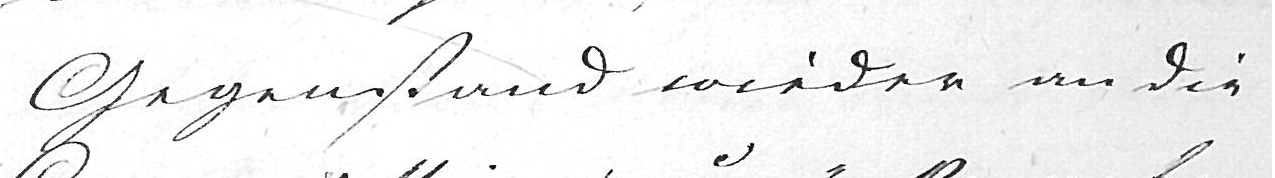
Gegenstand wieder an die
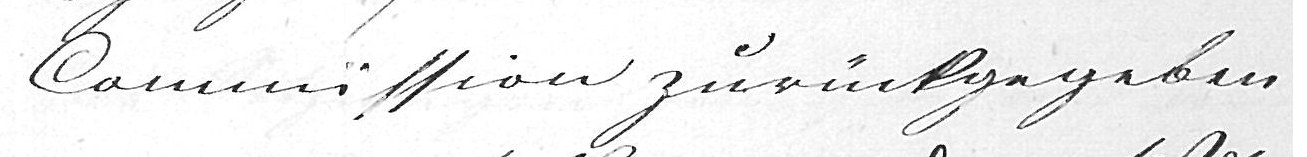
Commission zurückgegeben
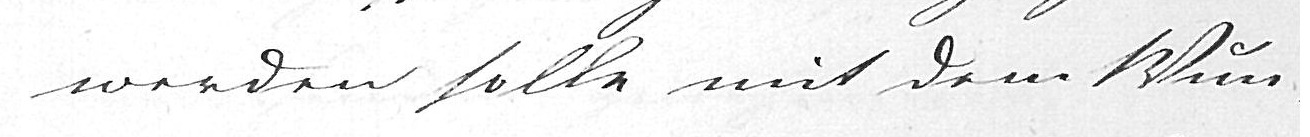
werden solle mit dem Wun-
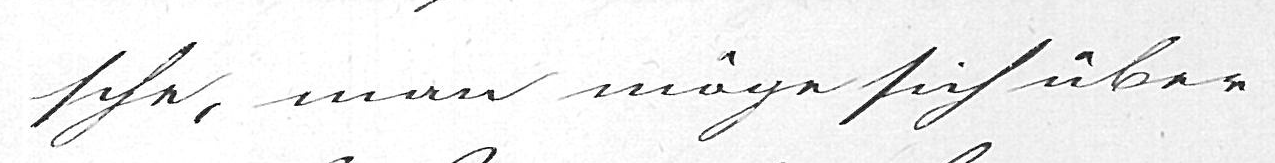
sche, man möge sich über
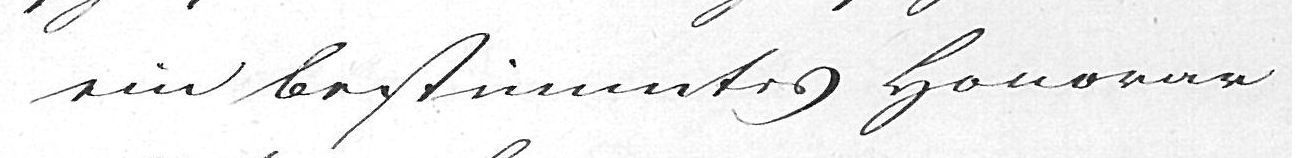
ein bestimmtes Honorar
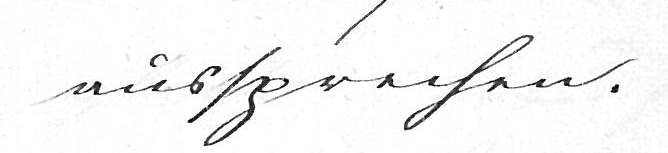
aussprechen.
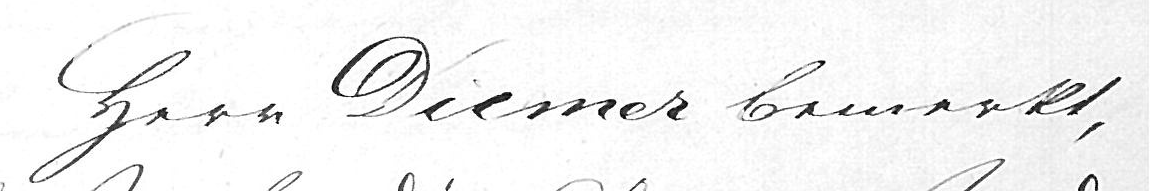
Herr Diemer bemerkt,
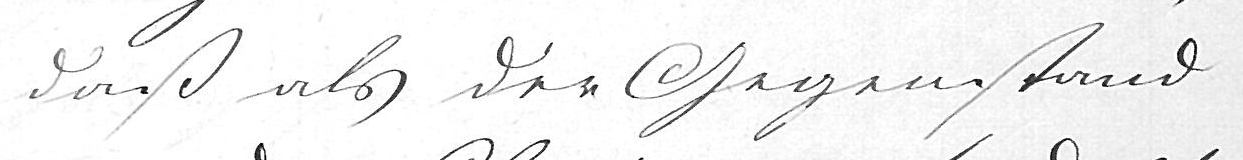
daß als der Gegenstand
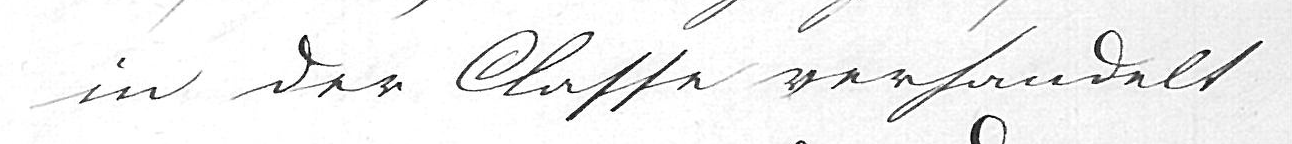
in der Classe verhandelt
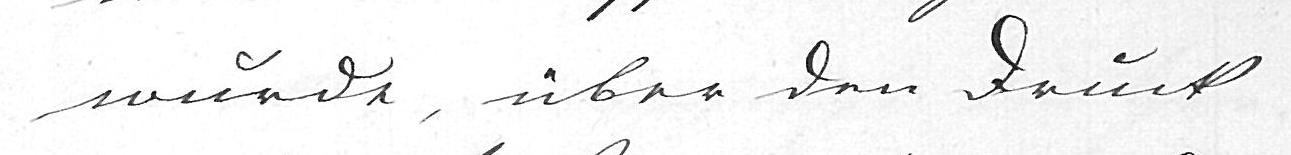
wurde, über den Druck
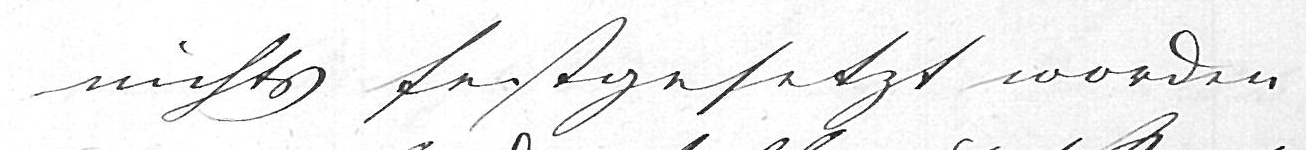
nichts festgesetzt worden
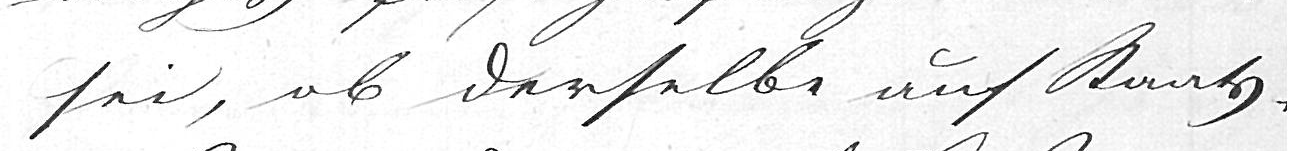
sei, ob derselbe auf Staats-
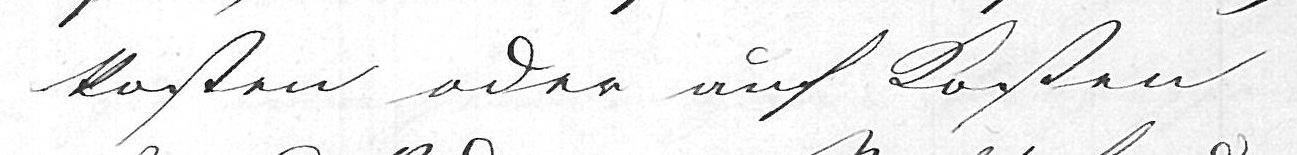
kosten oder auf Kosten
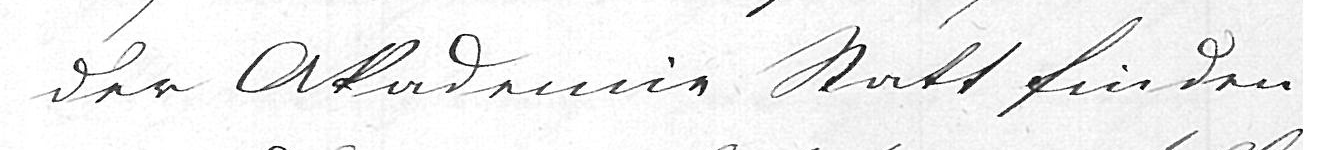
der Akademie Statt finden
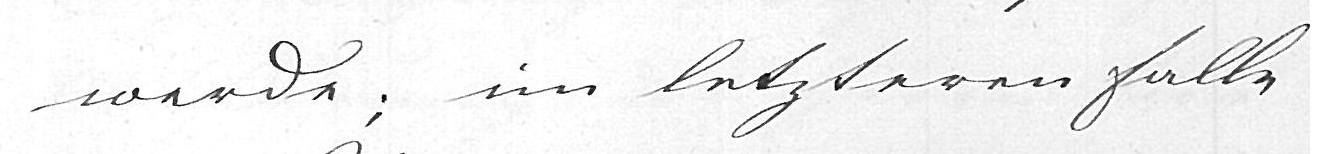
werde; im letzteren Falle
